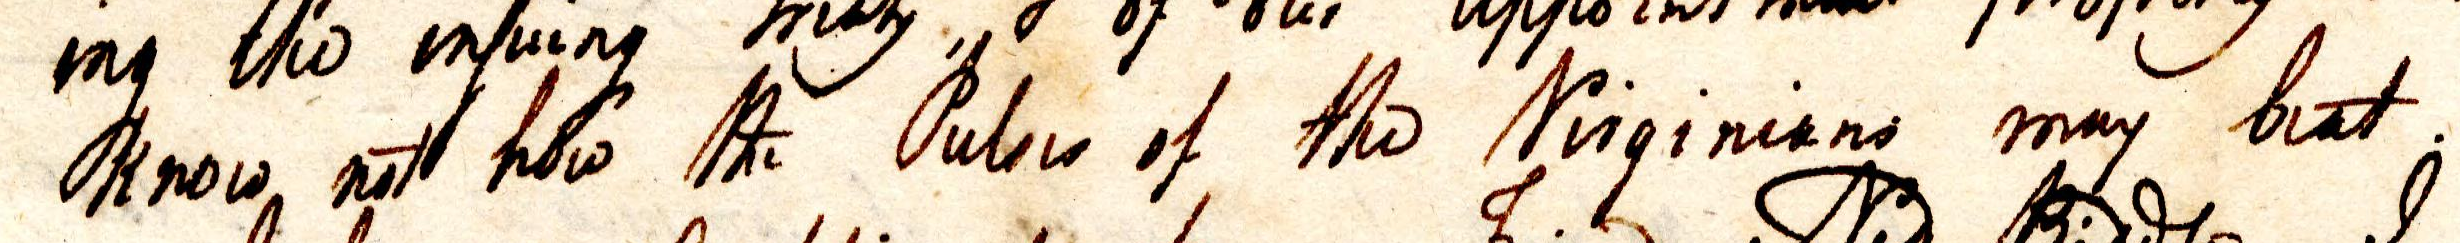know not how the Pulses of the Virginians may beat.
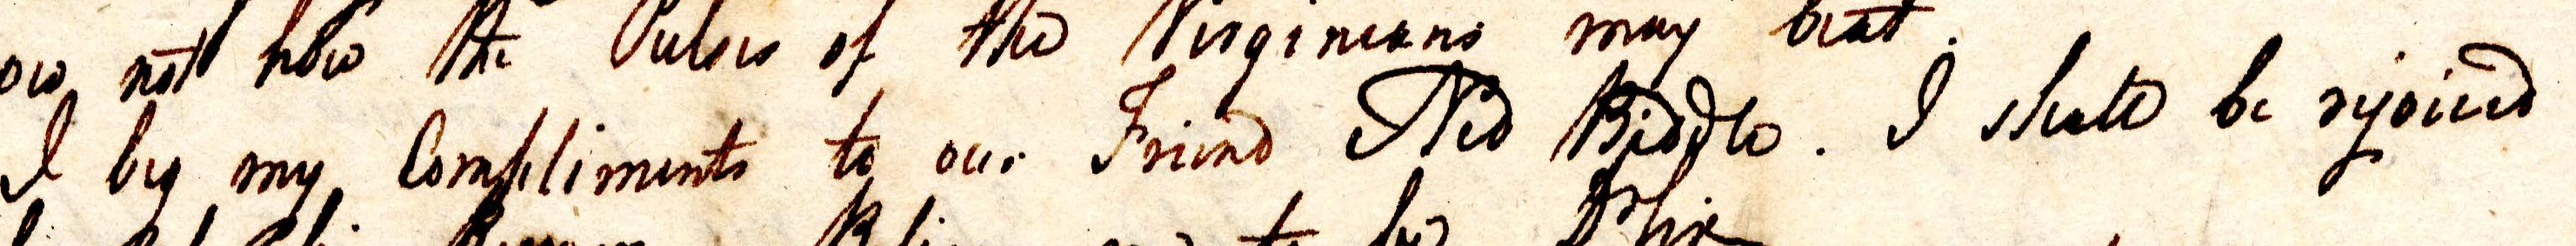I beg my Compliments to our Friend Ned Riddle. I shall be rejoiced
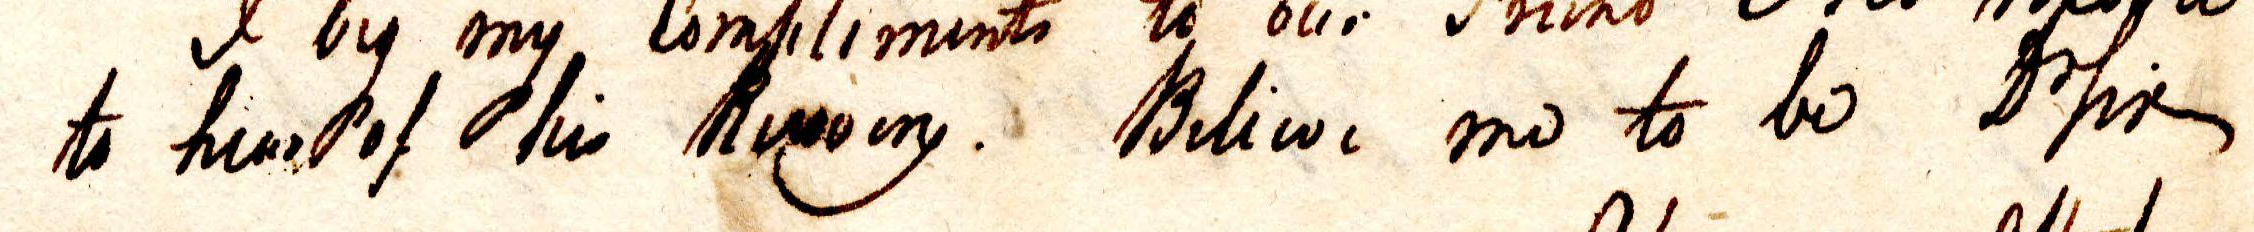to hear of his Recovery. Believe me to be D^r Sir
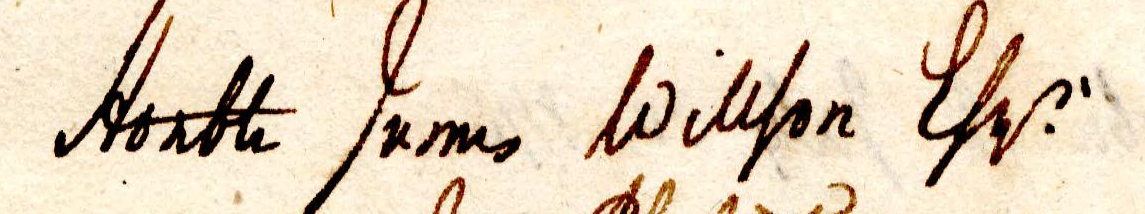Honble James Willson Esq^r.
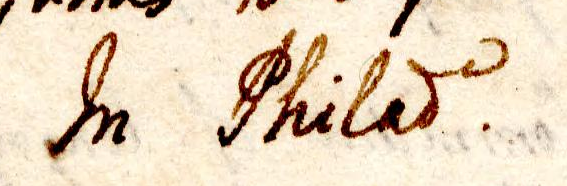In Philad^a.
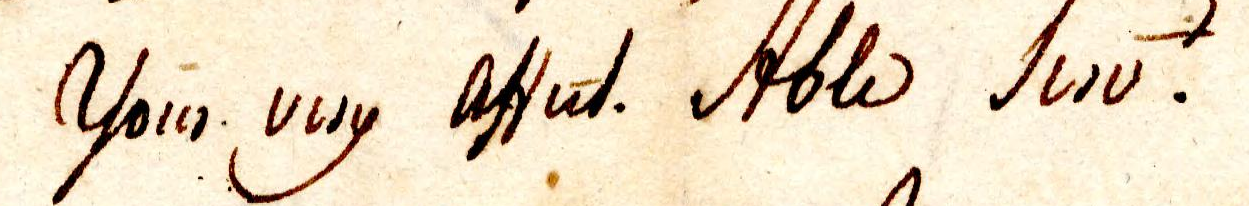Your very affect. Hble Serv^t.
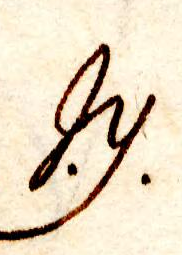J.Y.
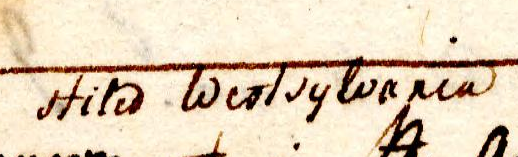stiled Westsylvania
